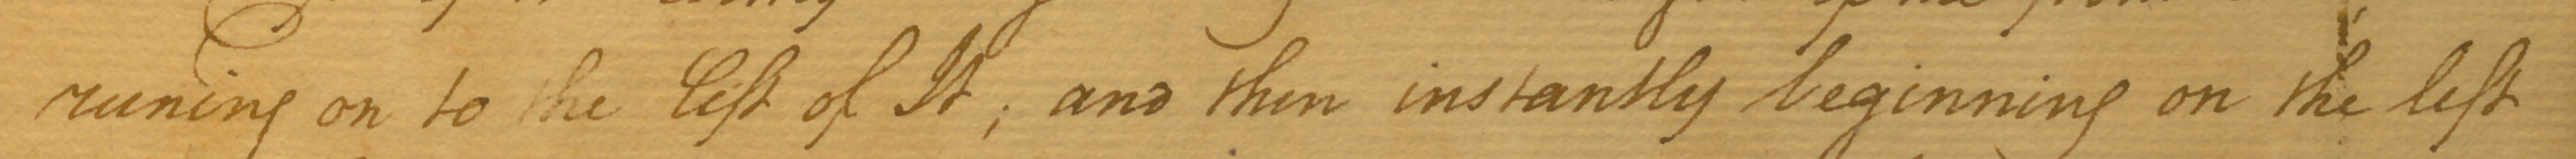runing on to the left of It; and then instantly beginning on the left
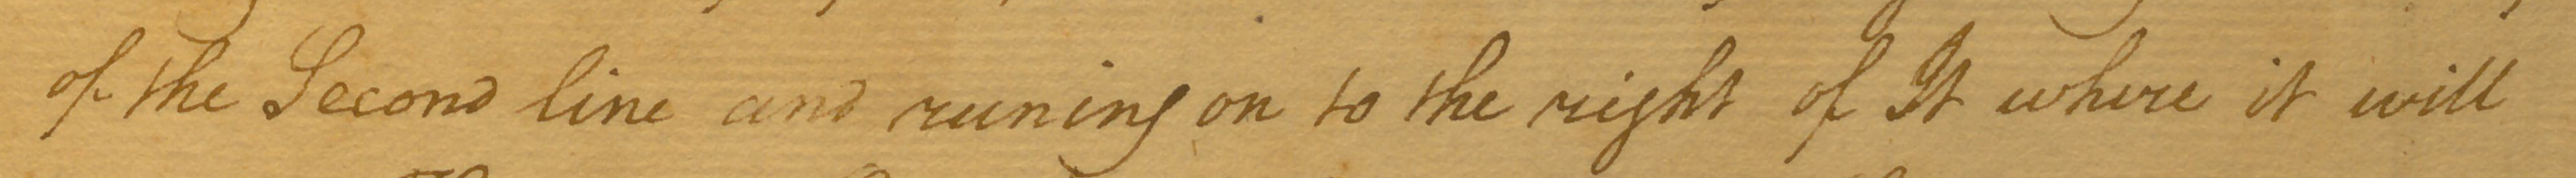of the Second line and running on to the right of It where it will
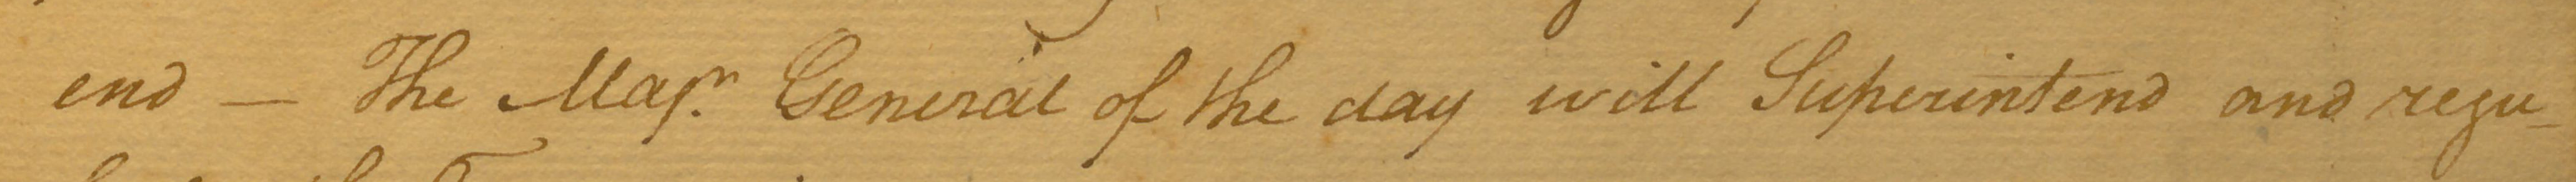end- The Maj^r. General of the day will Superintend and regu-
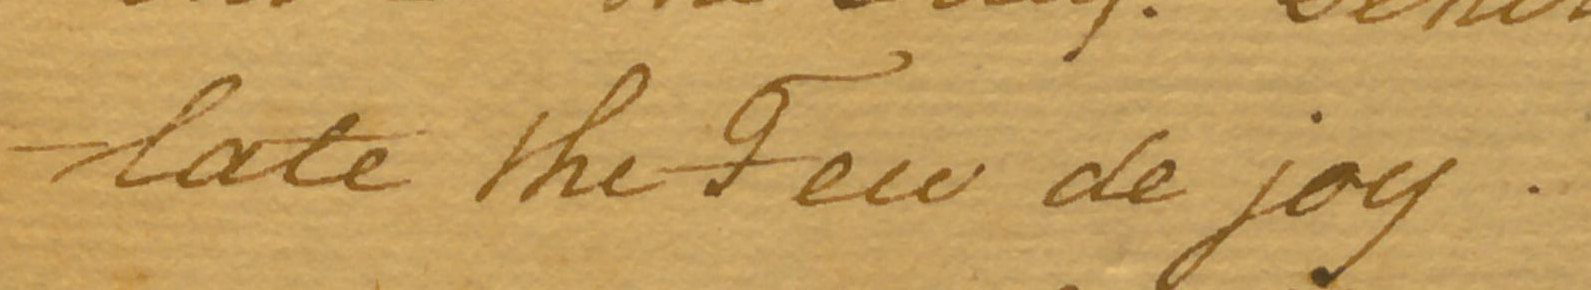-late the Feu de joy.
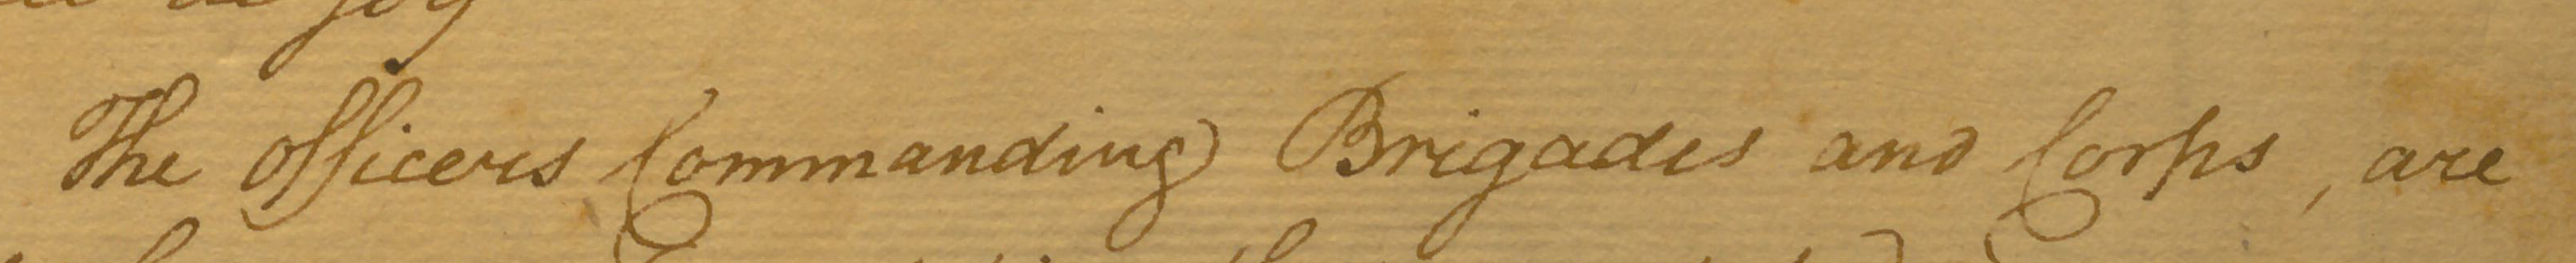The officers Commanding Brigades and Corps are
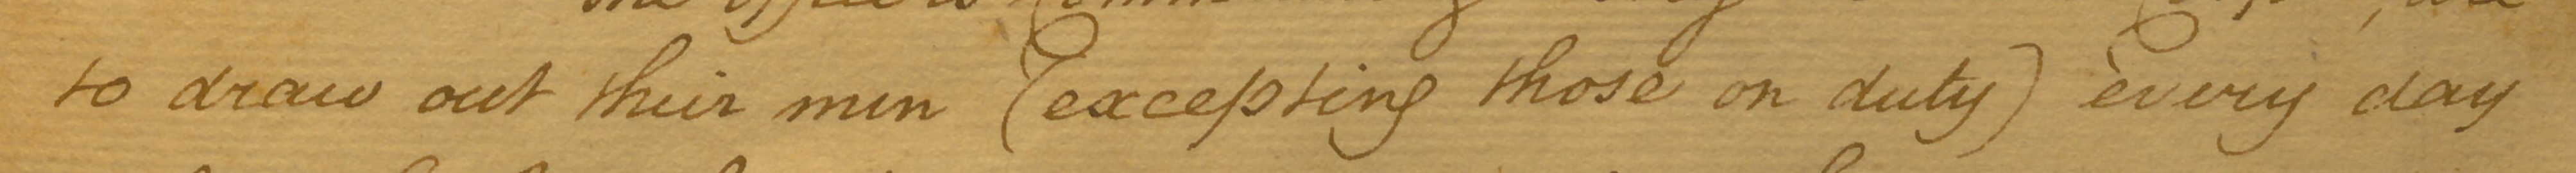to draw out their men (excepting those on duty) every day
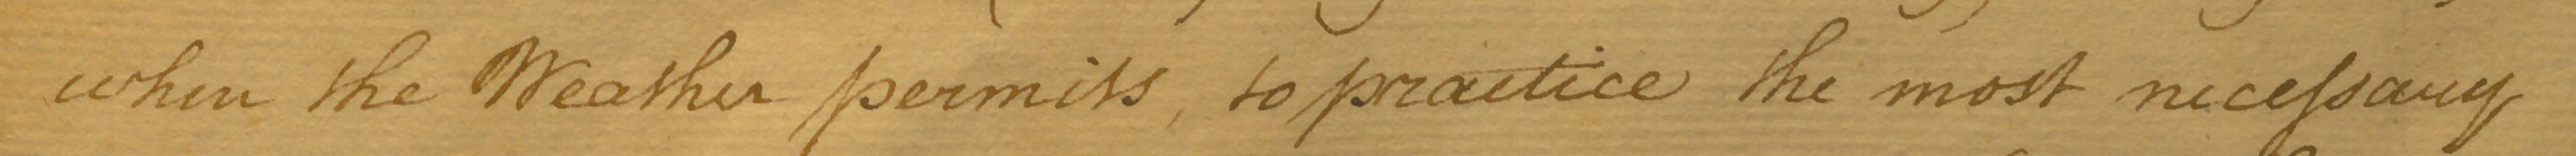when the Weather permits to practice the most necessary
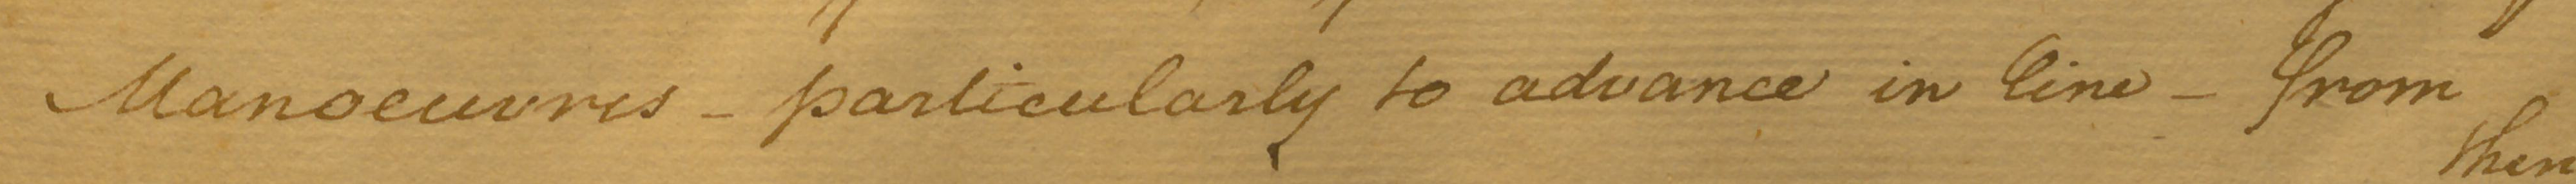Manoeuvres- particularly to advance in line- from
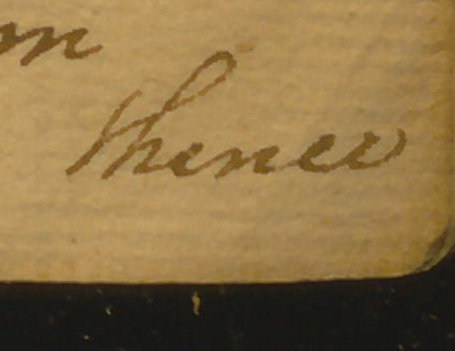thence
